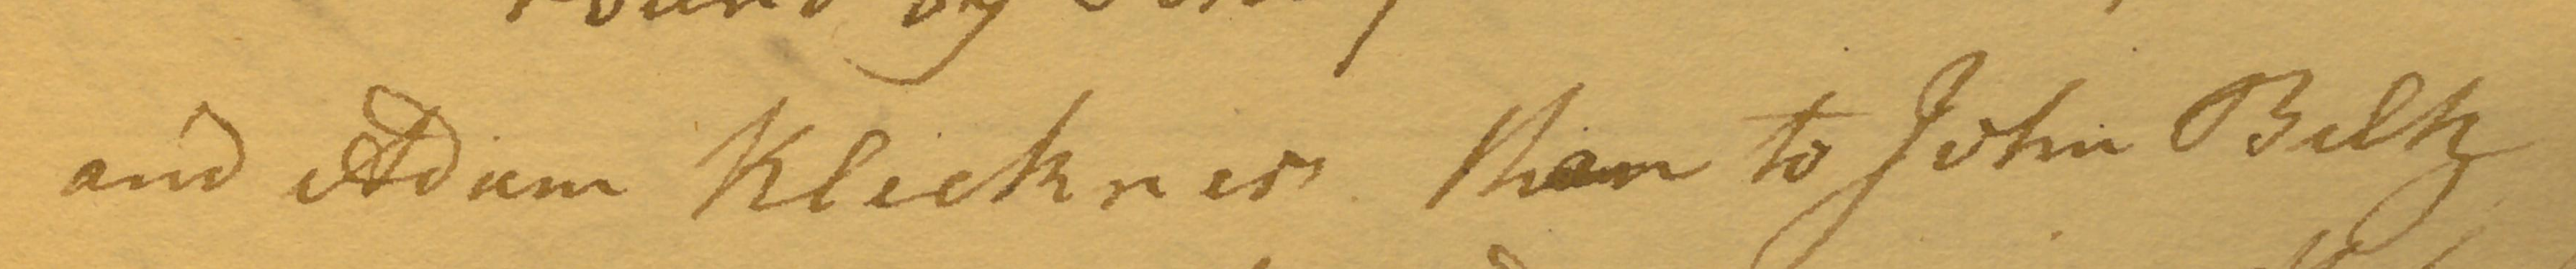and Adam Klickners than to John Beltz
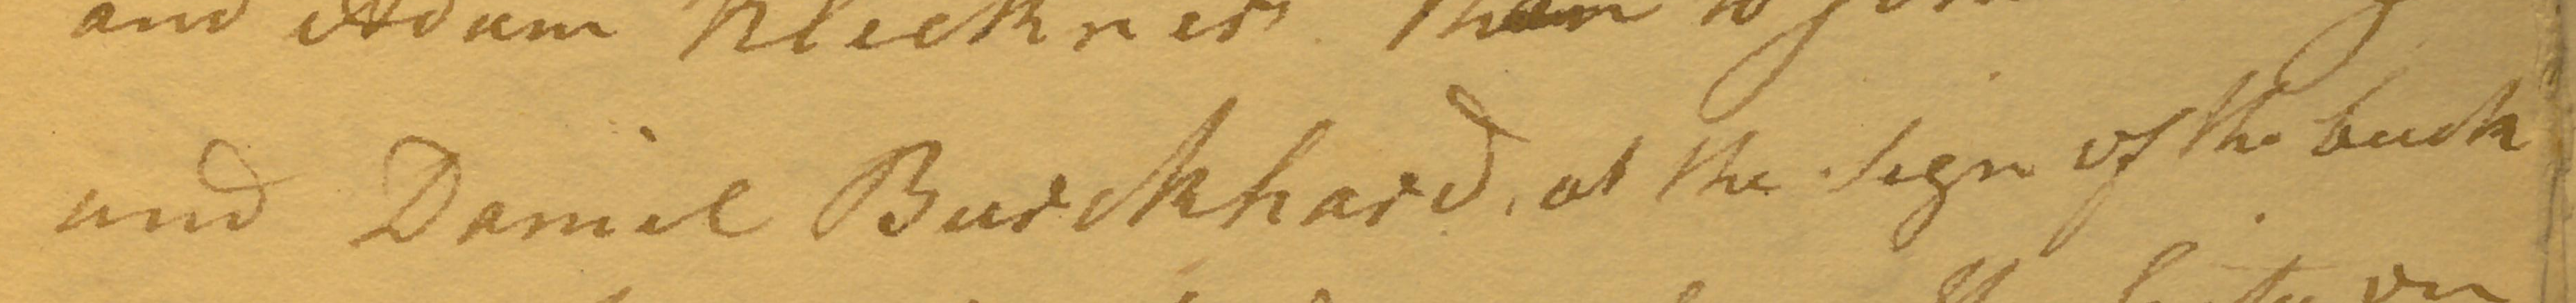and Damel Burckhard at the sign of the buck
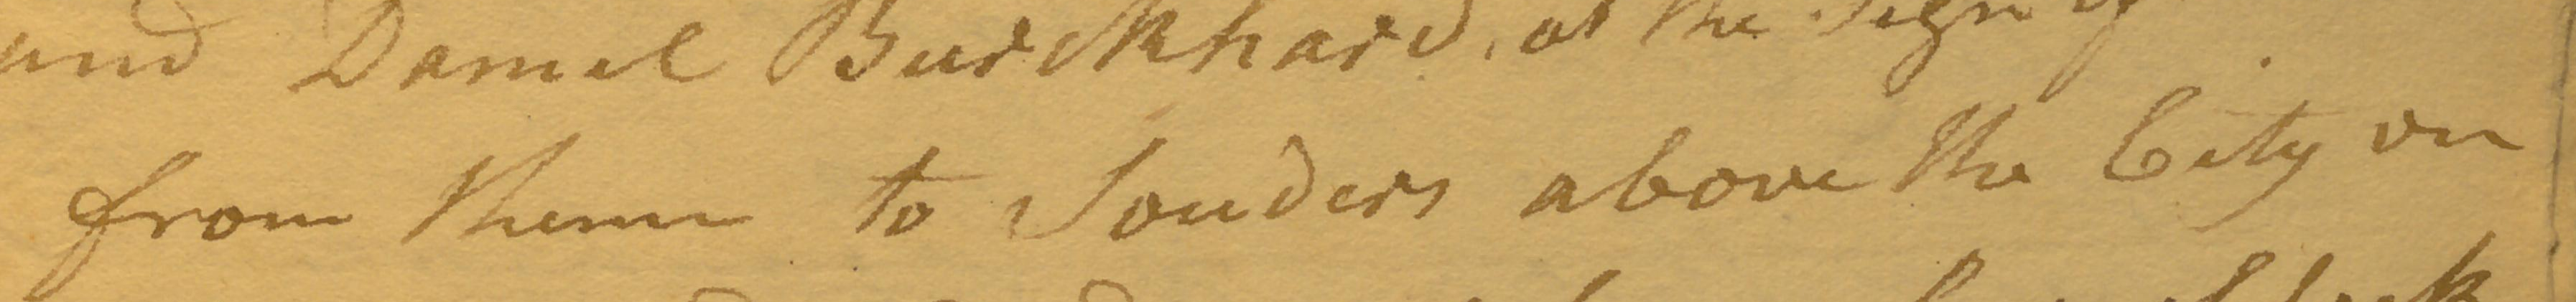from thence to Sonders above the City on
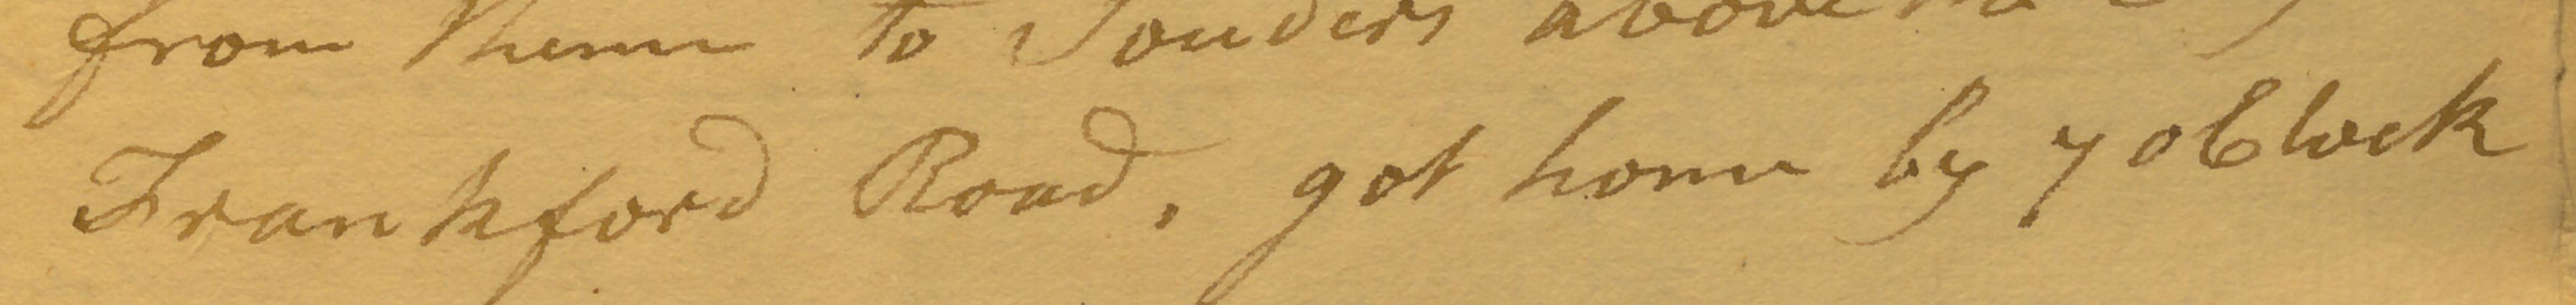Frankford Road, got home by 7 oClock
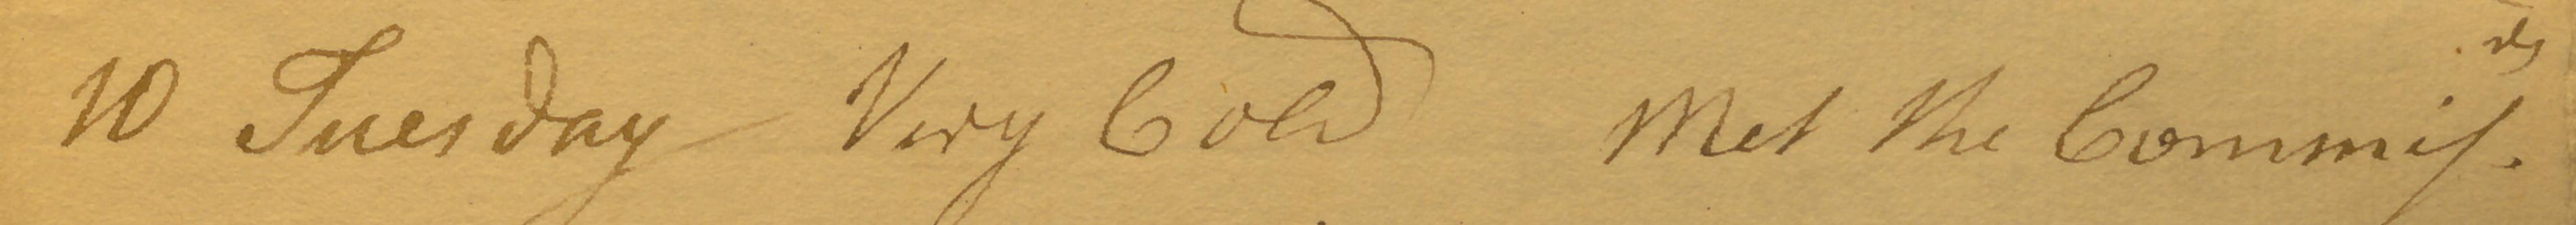10 Tuesday Very Cold Met the Commis.
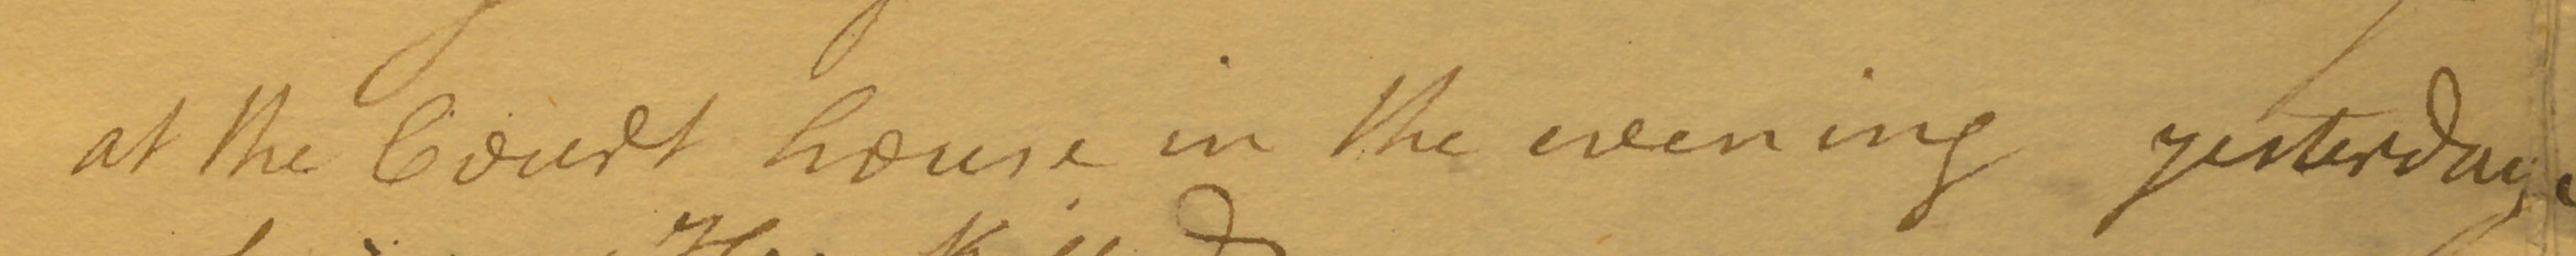at the Court house in the evening yesterday
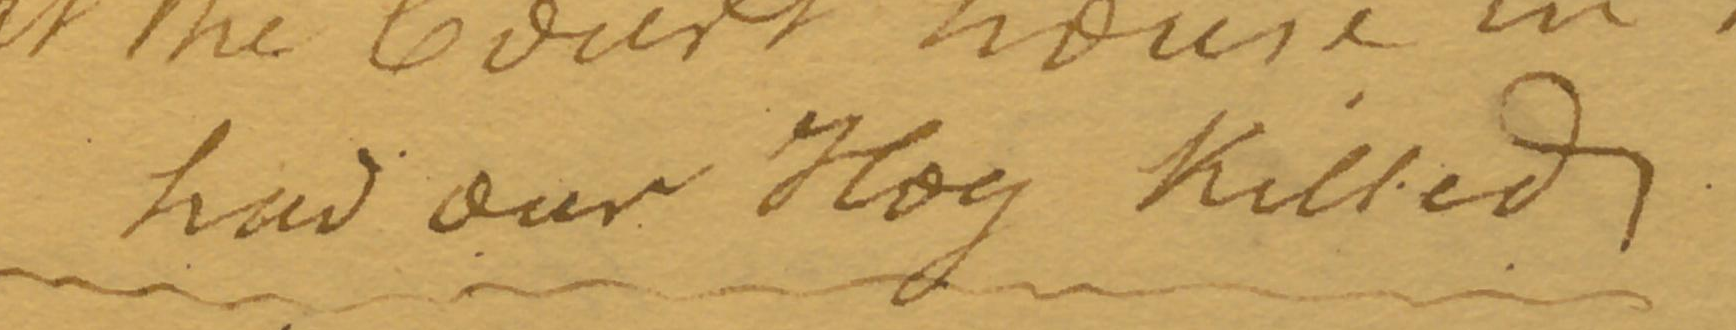had our Hog killed
